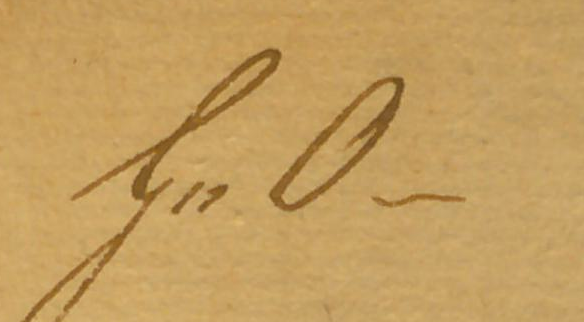G. O-
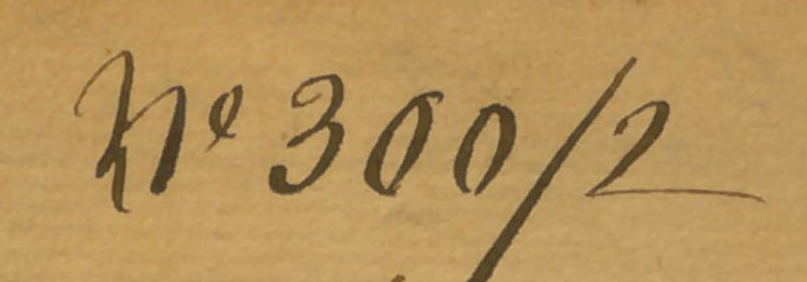N^o 300/2
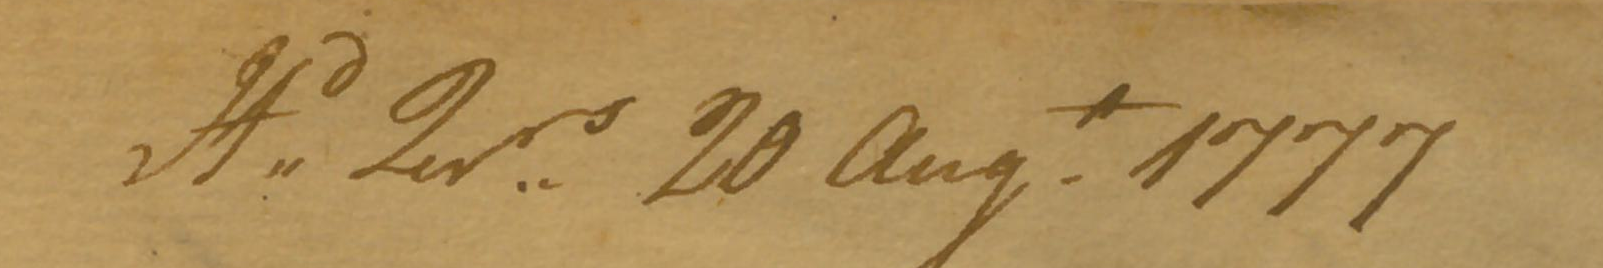H^d. Qu^rs. 20 Aug^t. 1777
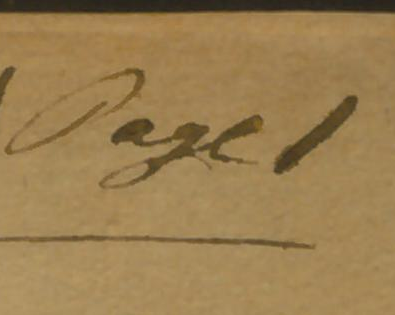Page 1
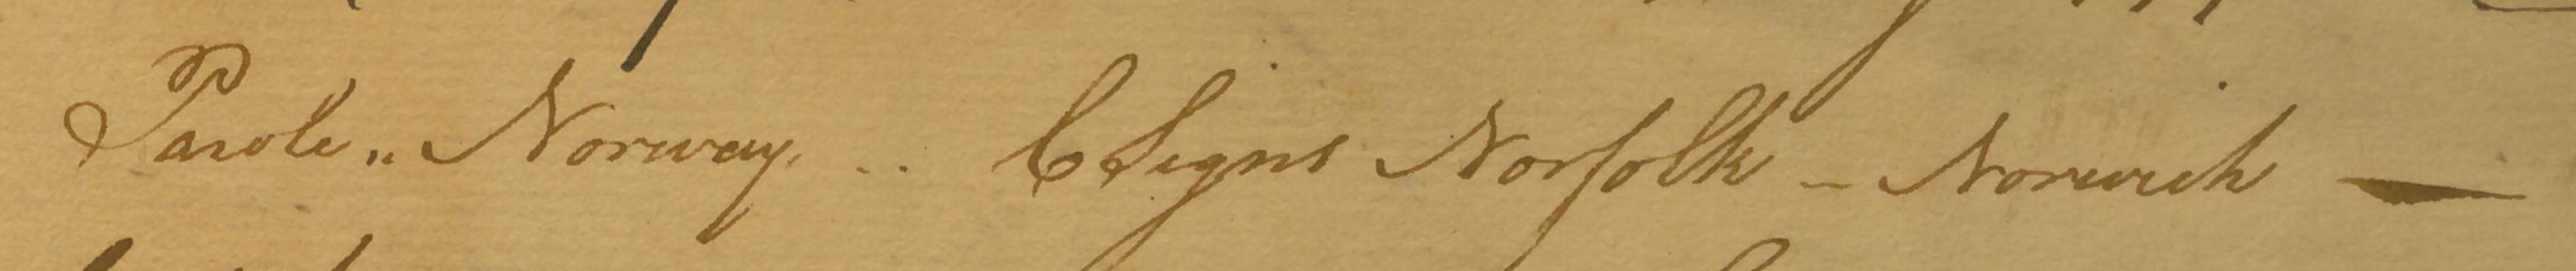Parole.. Norway... C Signs Norfolk- Norwich-
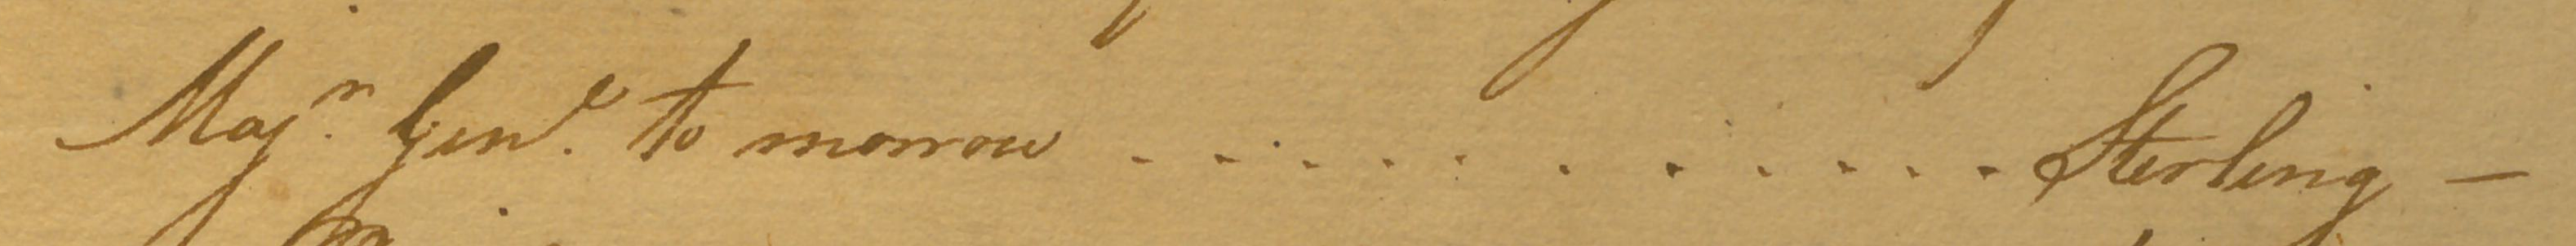Maj^r. Gen^l. to morrow ........... Sterling-
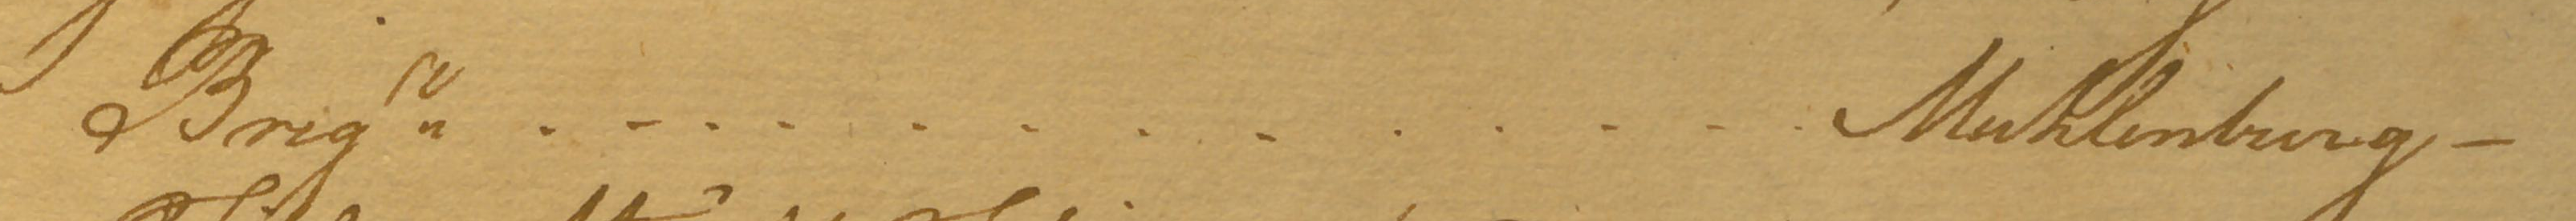Brig^r. ............ Muhlenburg-
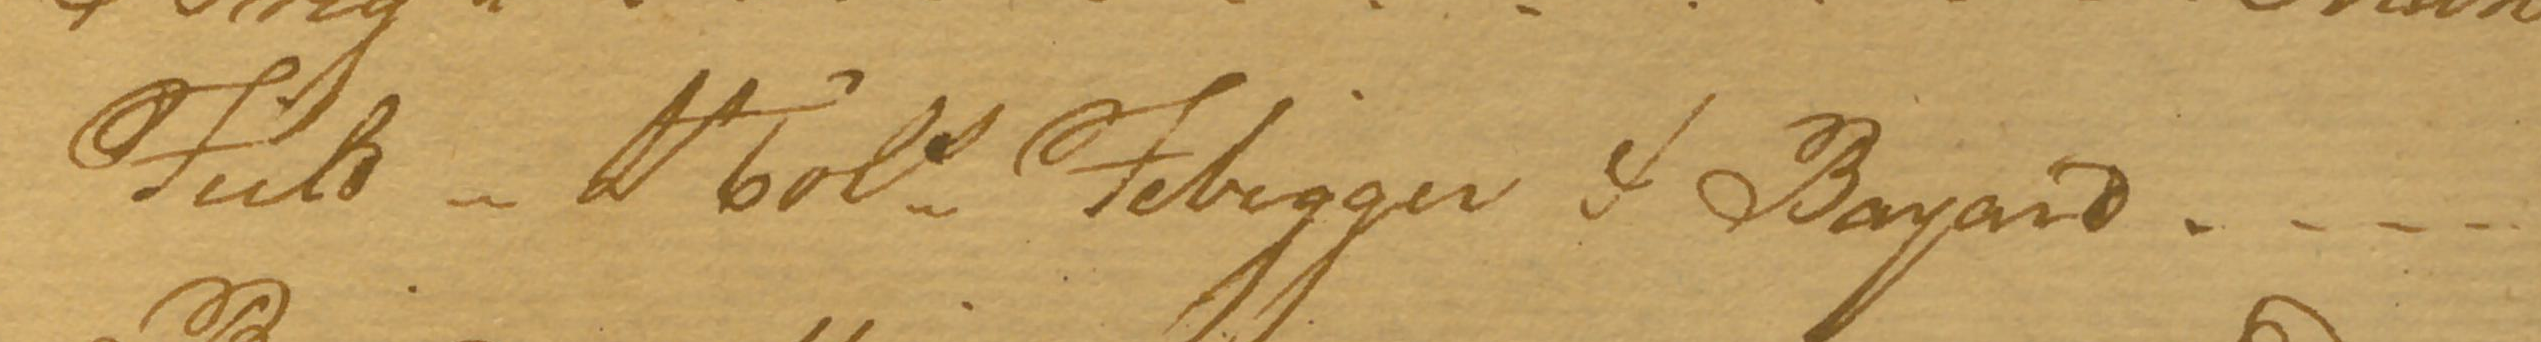Field- L^t Col^o Febigger & Bayard....
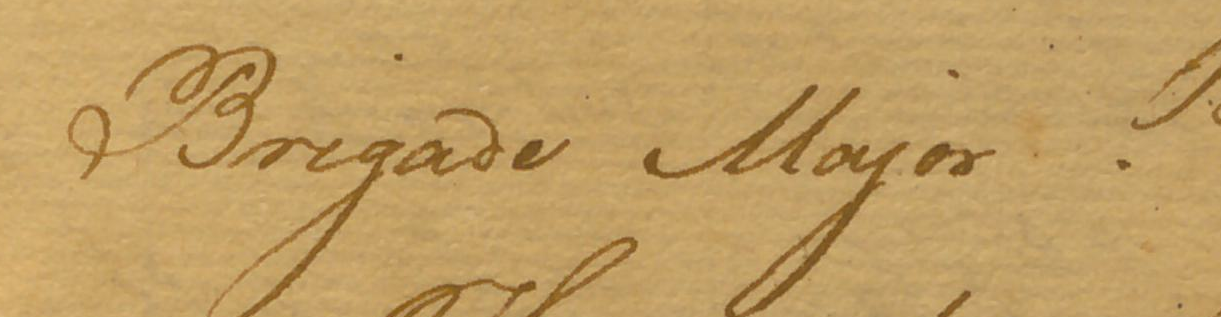Brigade Major.
